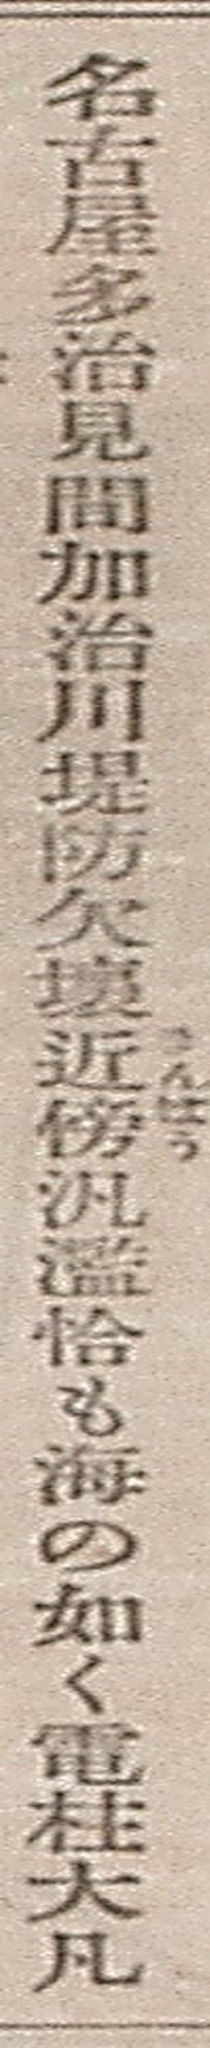名古屋多治見間加治川堤防欠壊近傍汎濫恰も海の如く電柱大凡
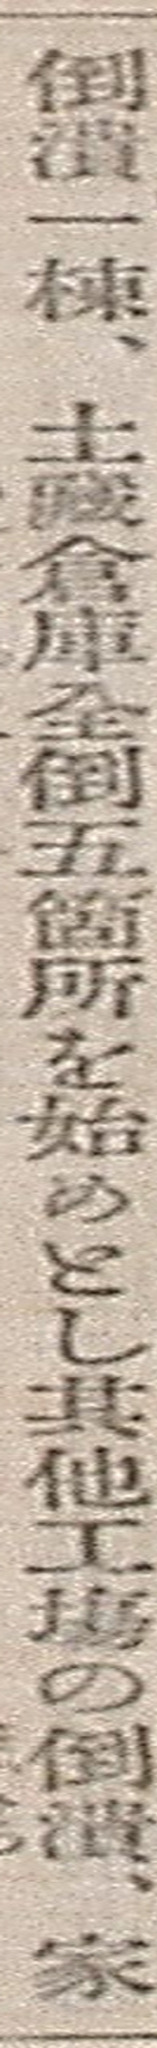倒潰一棟、土蔵倉庫全倒五箇所を始めとし其他工場の倒潰、家
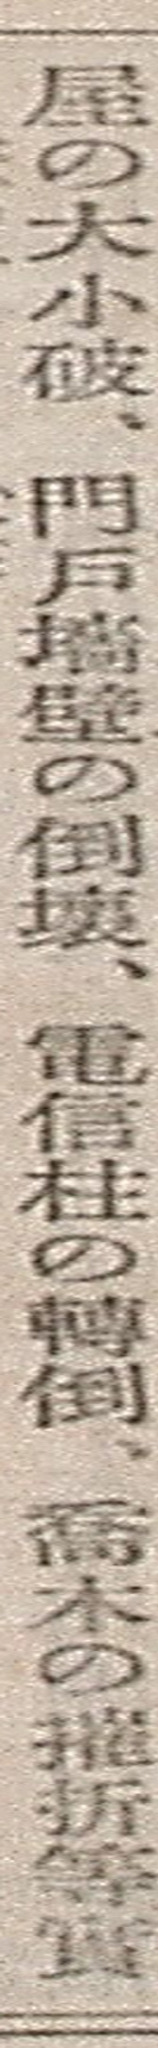屋の大小破、門戸墻壁の倒壊、電信柱の転倒、喬木の摧折等実
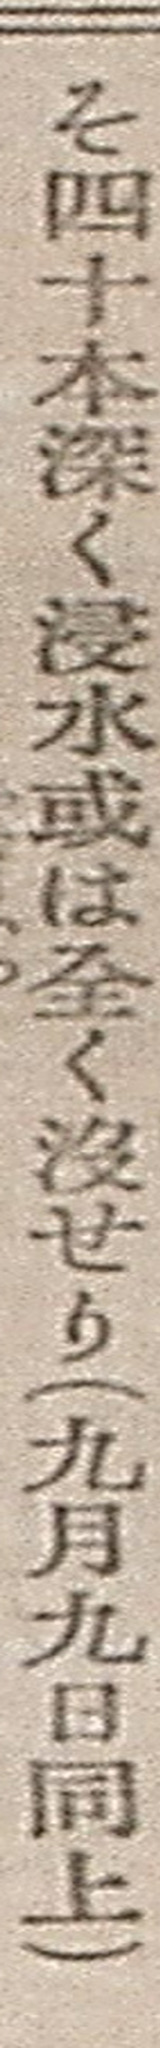そ四十本深く浸水或は全く没せり
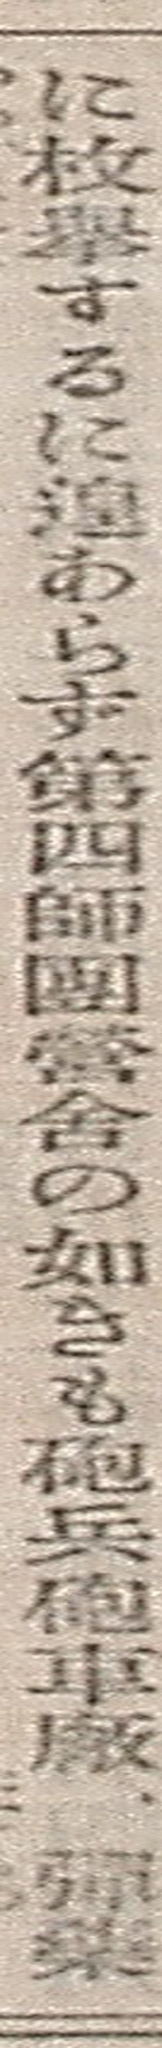に枚挙するに遑あらず第四師団営舎の如きも砲兵砲車廠、弾薬
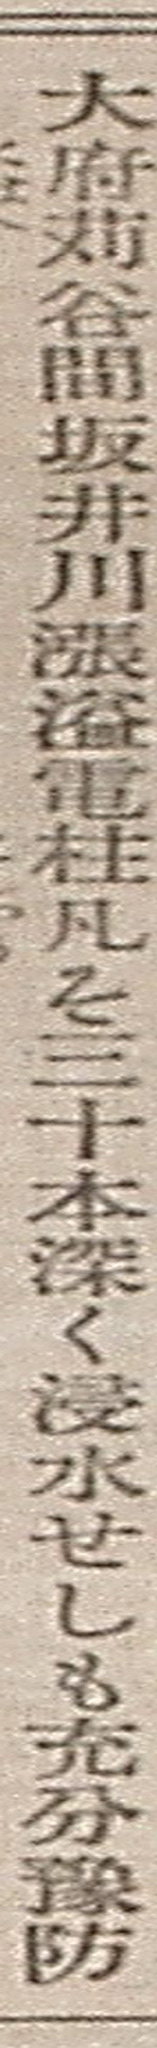大府苅谷間坂井川漲溢電柱凡そ三十本深く浸水せしも充分予防
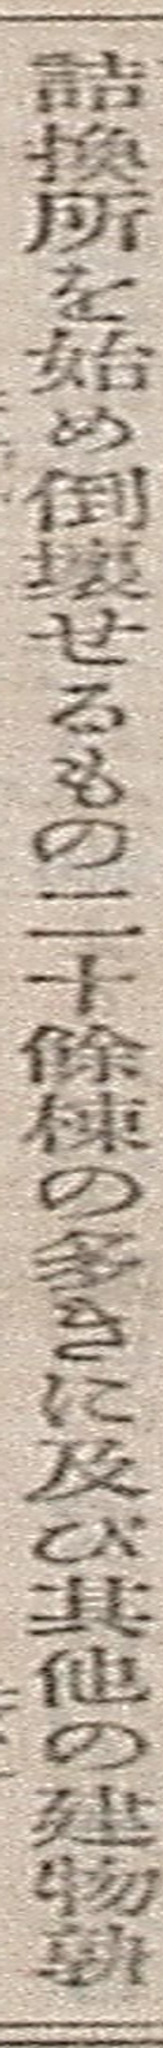詰換所を始め倒壊せるもの二十餘棟の多きに及び其他の建物孰
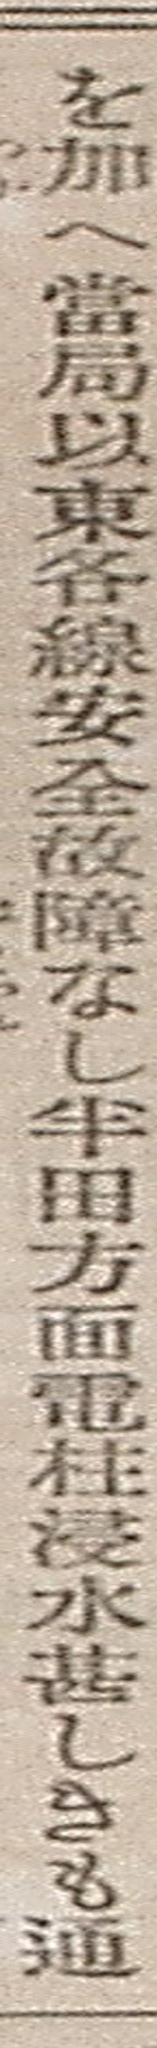を加へ当局以東各線安全故障なし半田方面電柱浸水甚しきも通
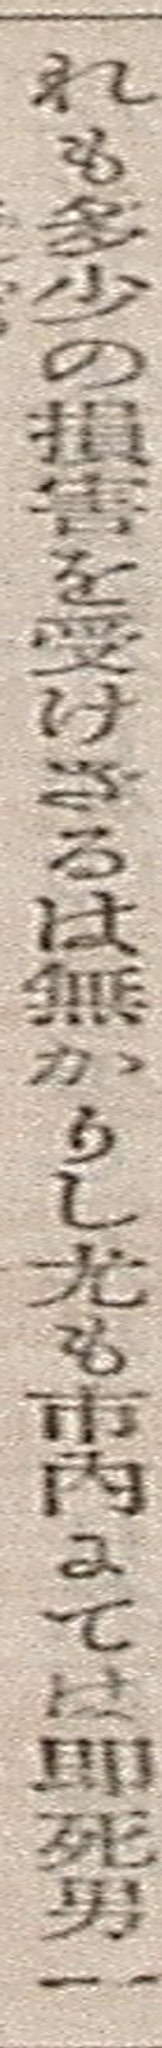れも多少の損害を受けざるは無かりし尤も市内にては即死男一
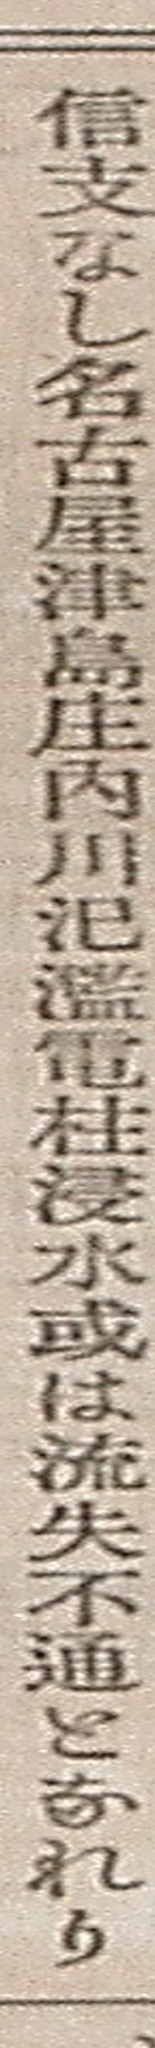信支なし名古屋津島庄内川氾濫電柱浸水或は流失不通となれり
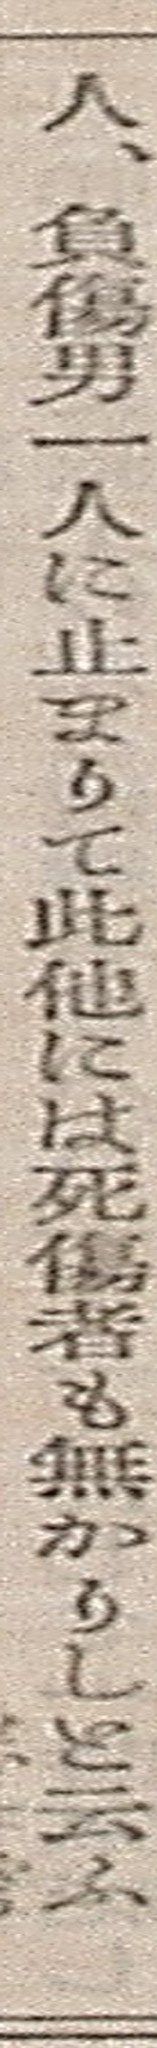人、負傷男一人に止まりて此他には死傷者も無かりしと云ふ
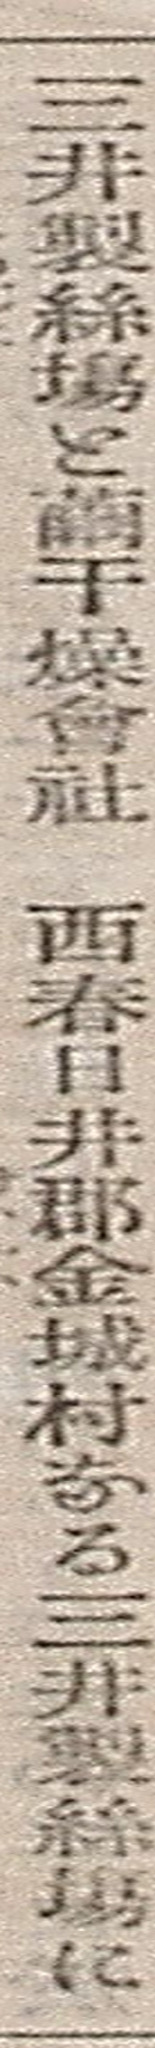三井製絲場と繭干燥會社西春日井郡金城村なる三井製絲場に
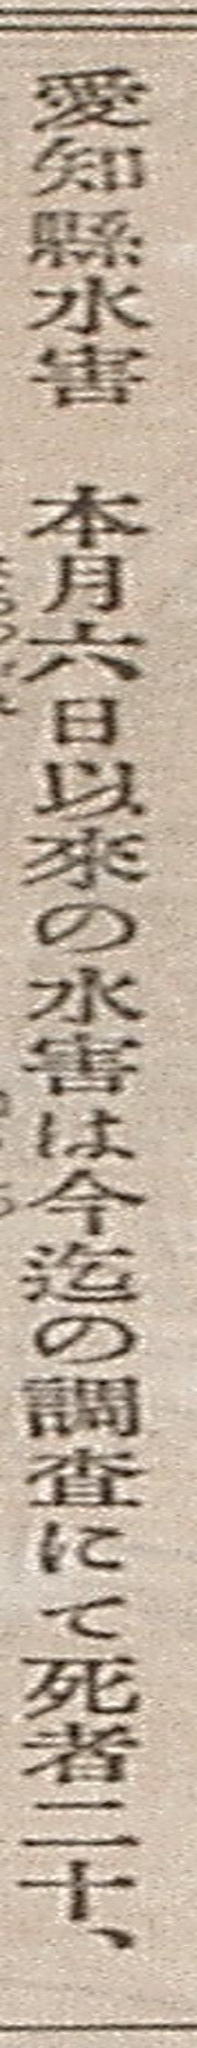愛知県水害本月六日以来の水害は今迄の調査にて死者二十、
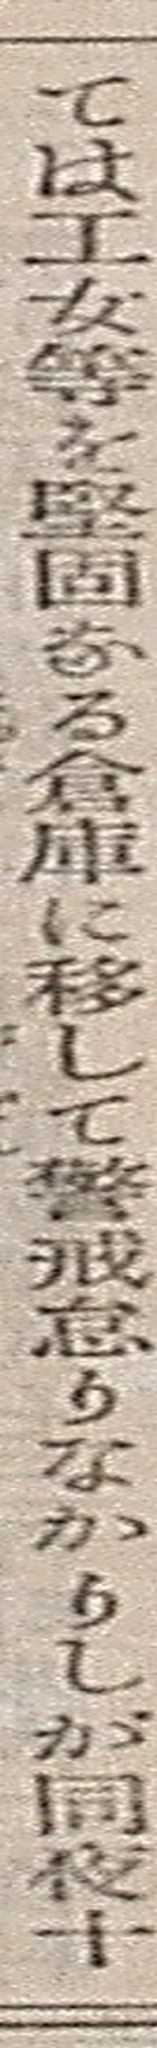ては工女等を堅固なる倉庫に移して警戒怠りなかりしが同夜十
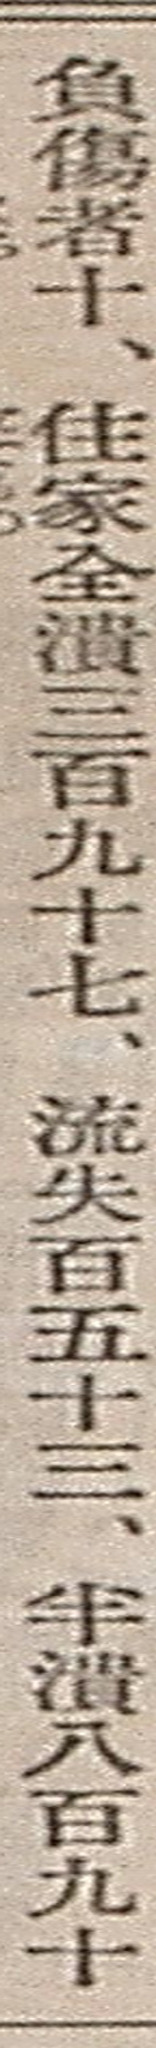負傷者十、住家全潰三百九十七、流失百五十三、半潰八百九十
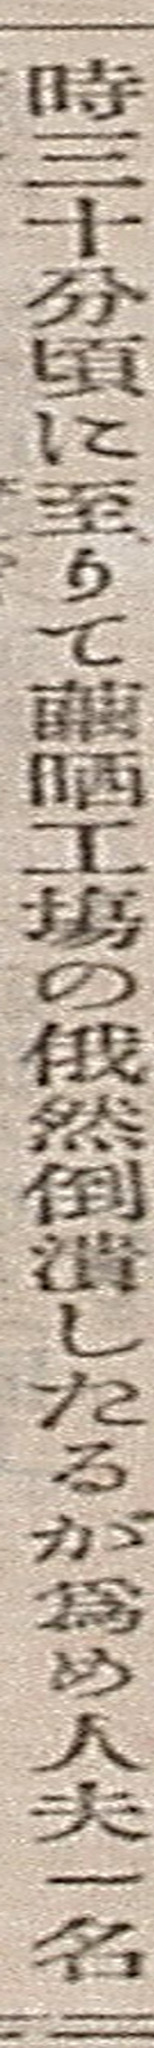時三十分頃に至りて繭晒工場の俄然倒潰したるが為め人夫一名
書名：風俗畫報臨時増刊第百二十六號　洪水被害録（中）
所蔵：東京大学地震研究所図書室 Earthquake Research Institute Library, The University of Tokyo, JAPAN
